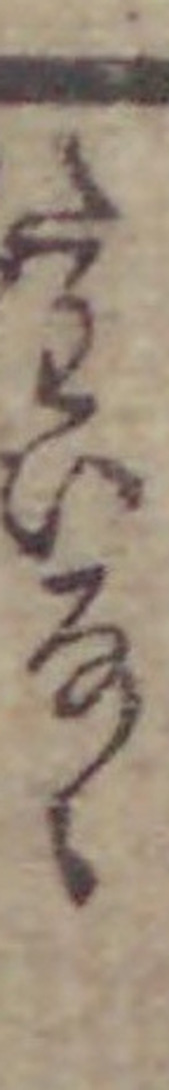たわいなく
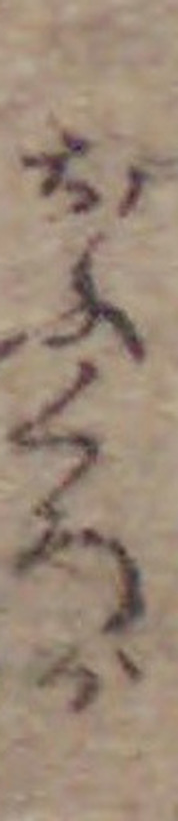おふくろが
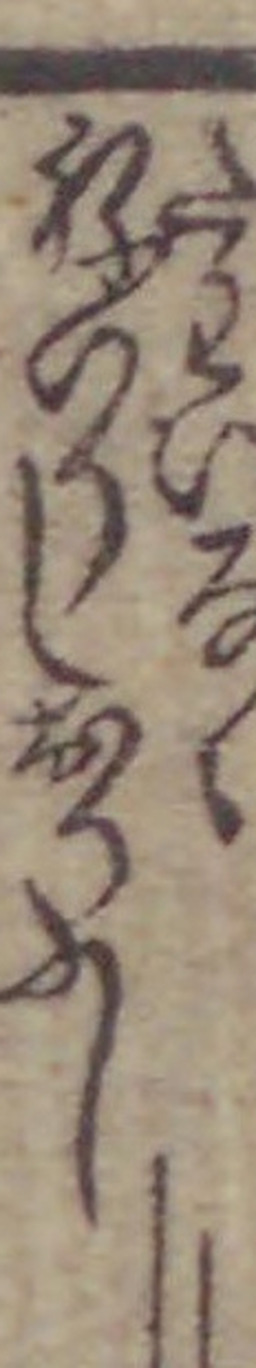ねいりしおりふし
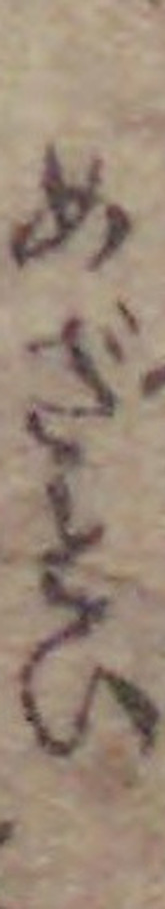めざとい
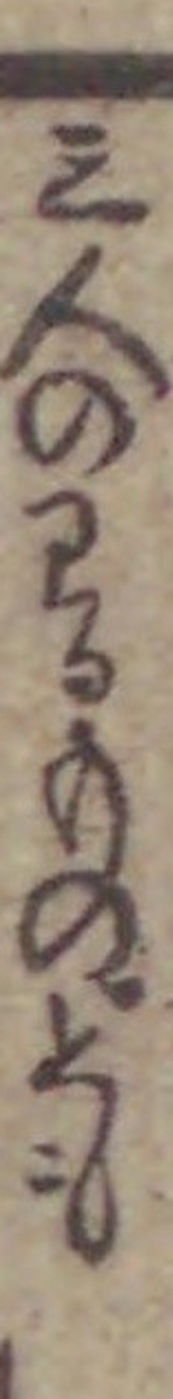三人のわるものども
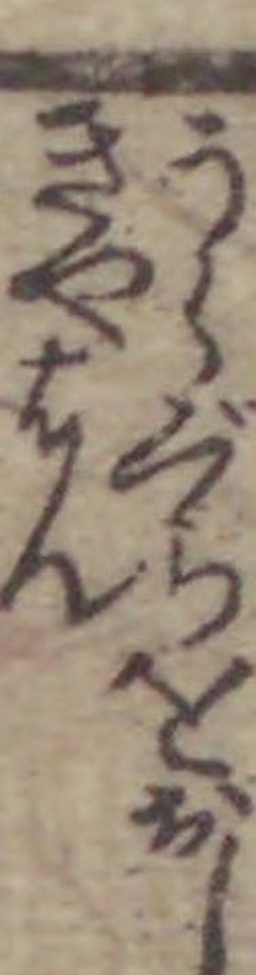きやはん
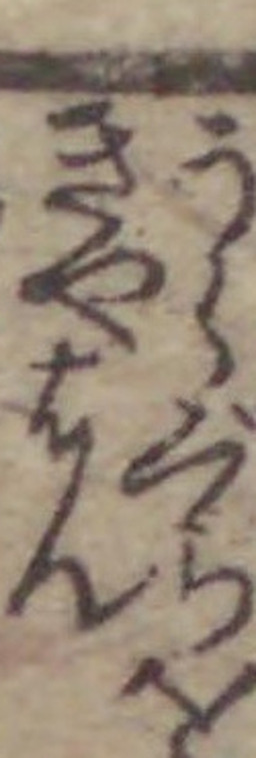きやはん
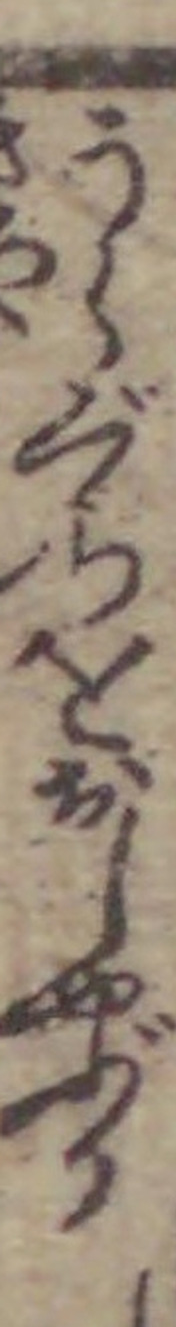うらぐちをおしやぶり
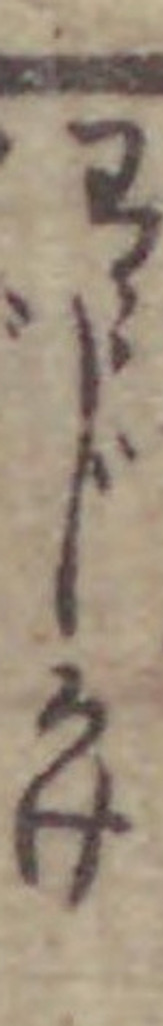わらじかけ
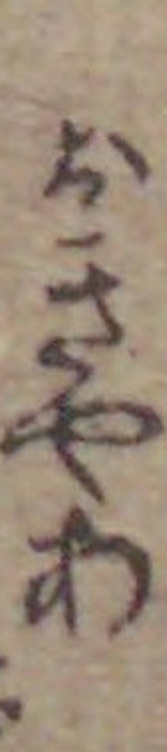おきやあ
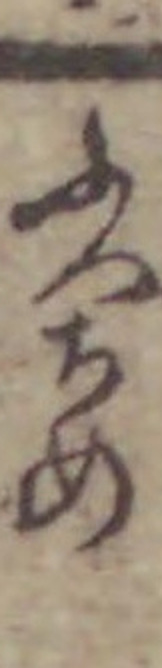ふつちめ
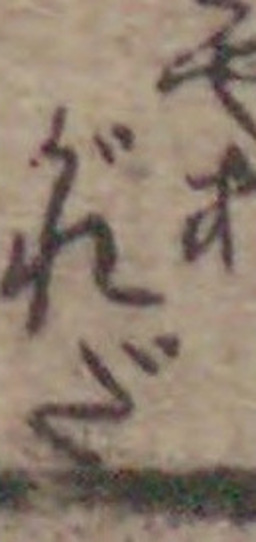がれだ
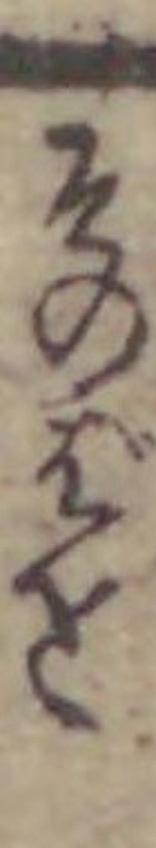そのばを
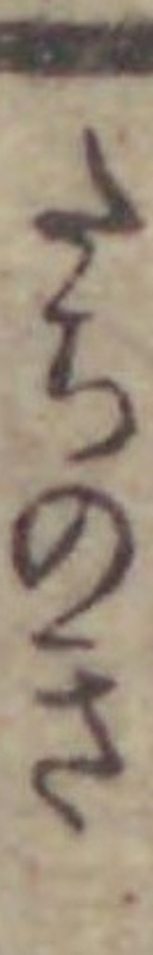たちのき

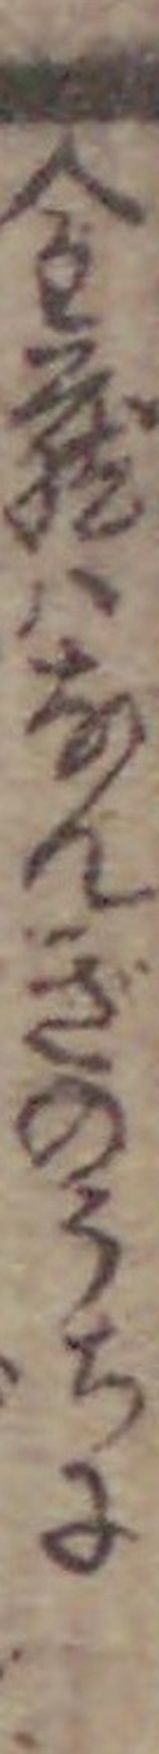金蔵はなんぎのうちに
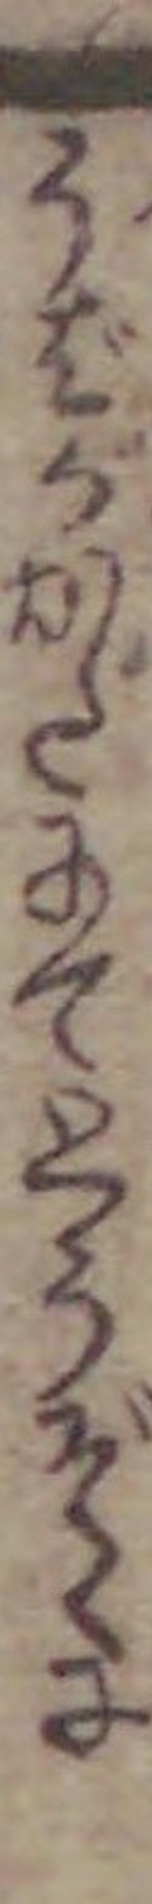うばがかたにてとうぞくに
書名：御代の御寶
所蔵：国立国会図書館 National Diet Library, JAPAN
